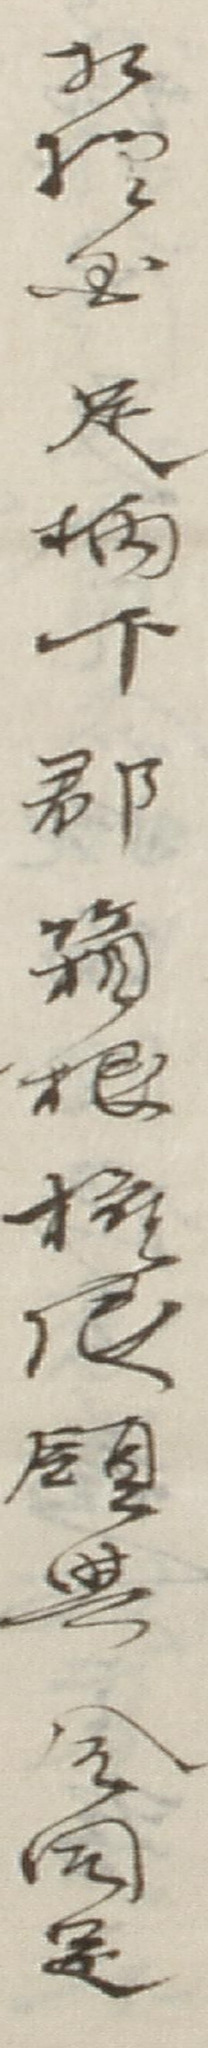相模国足柄下郡箱根権限領典仝国足
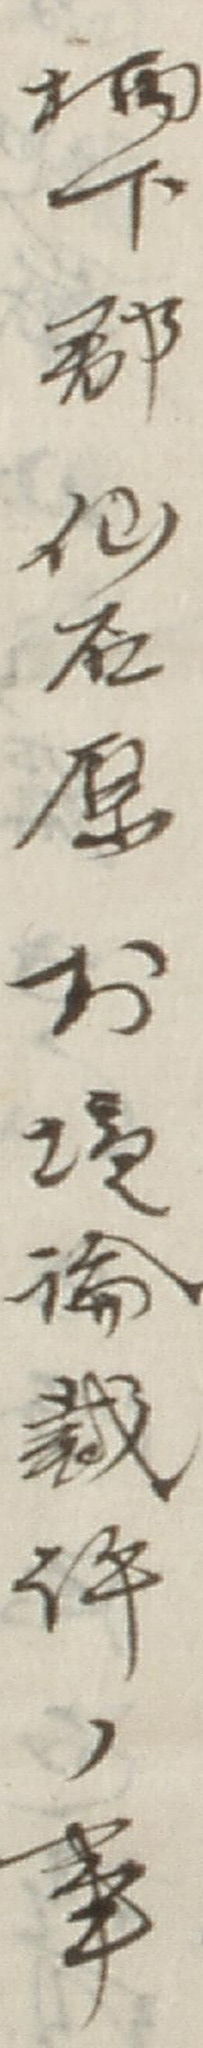柄下郡仙石原村境論裁件ノ事
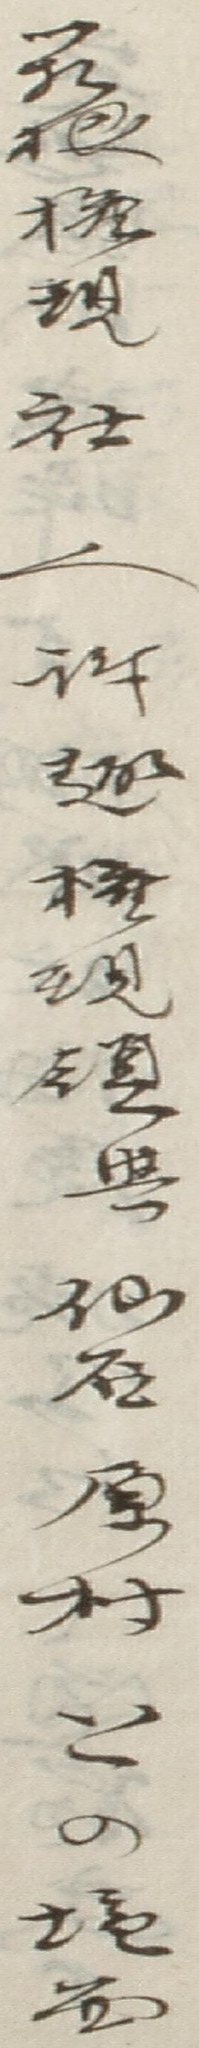箱根権現社へ訴趣権現領典仙石原村との境西
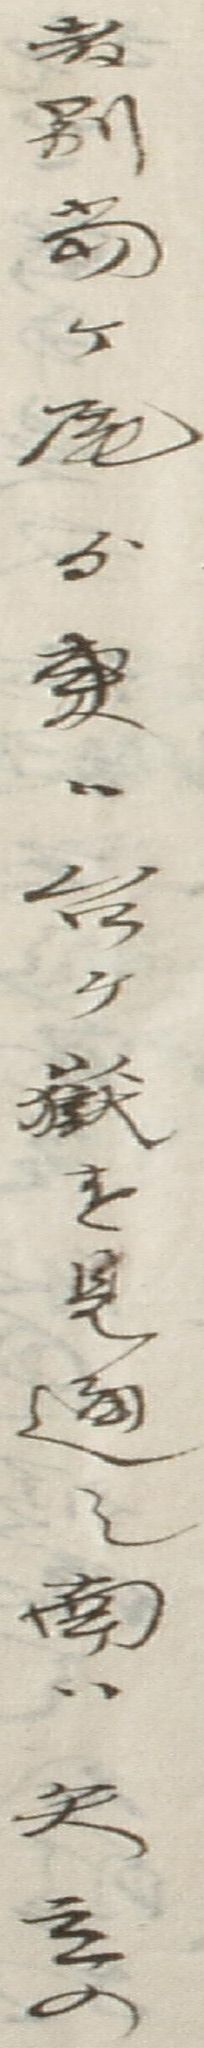者別当ケ尾ゟ東は台ヶ嶽を見通し南は矢立の
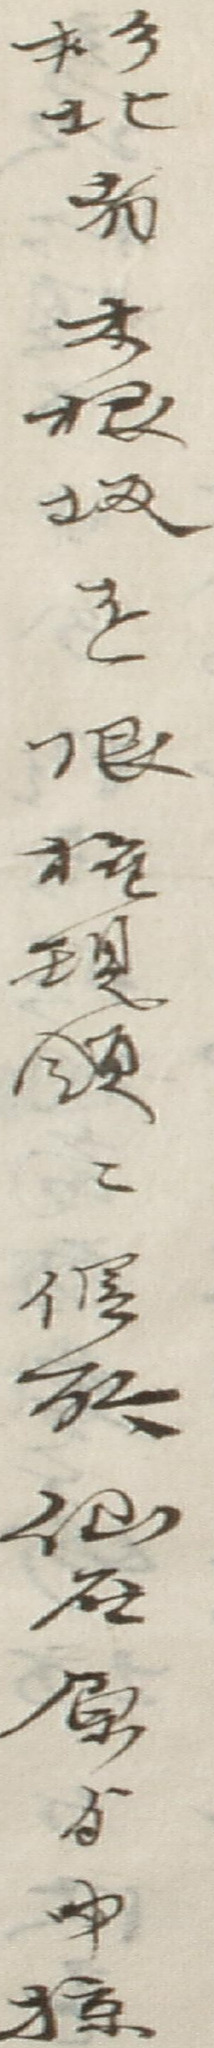杉北者木根坂を限権現領に候段仙石原ゟ申掠
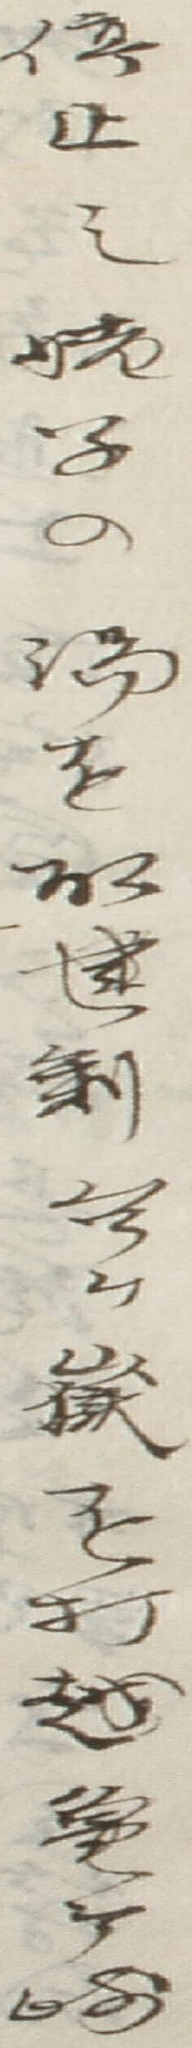停止之姥子の湯を故建制台ケ嶽を打越亀ヶ崎
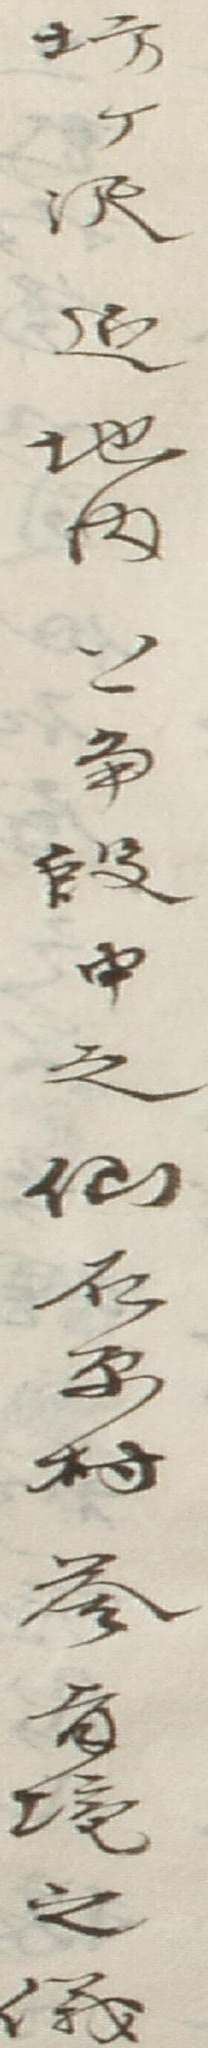坊ヶ沢近地内と争段申之仙石原村挙旨境之儀
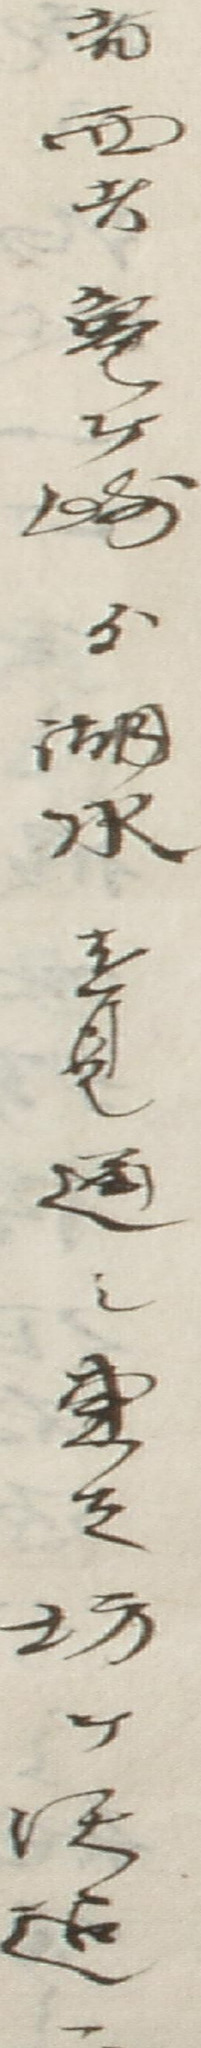者西者亀ヶ崎ゟ湖水を見通し東は坊ヶ沢迄ニ
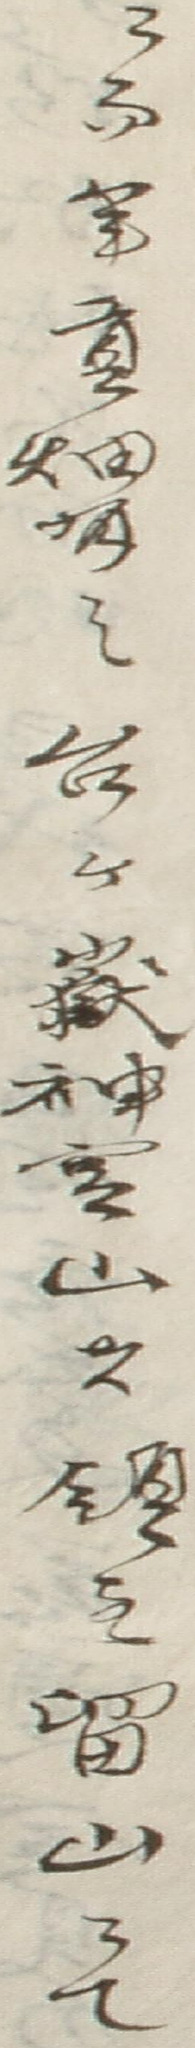ニて年貢畑背之台ヶ嶽神宮山之領主留山にて
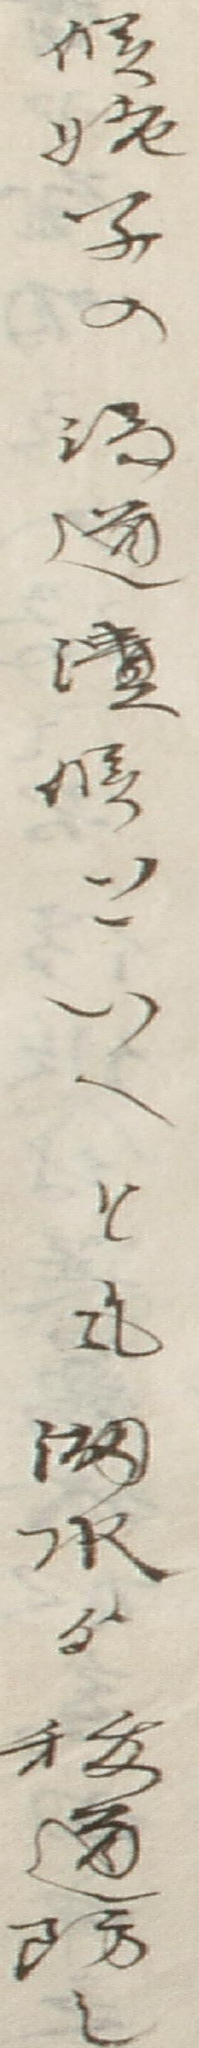候姥子の湯道潰候といへとも湖水ゟ抜道防し

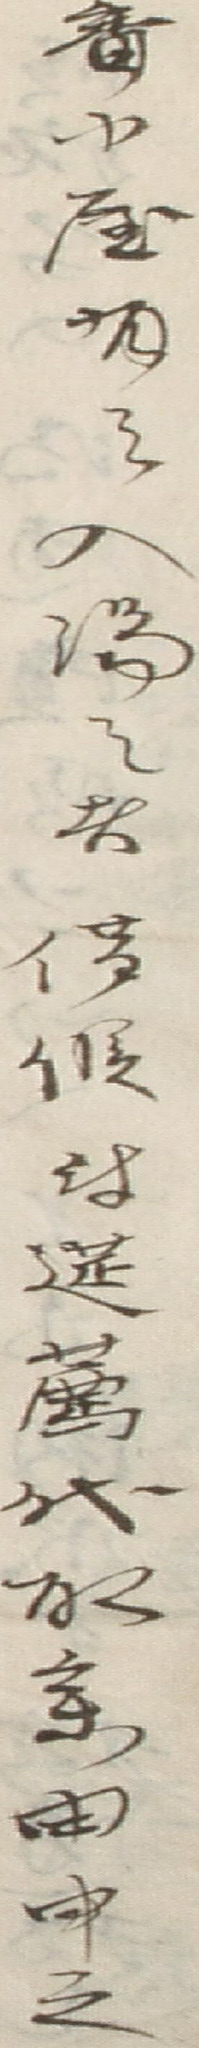番小屋有之入湯之者借候ニ付筵薦代取参由申之
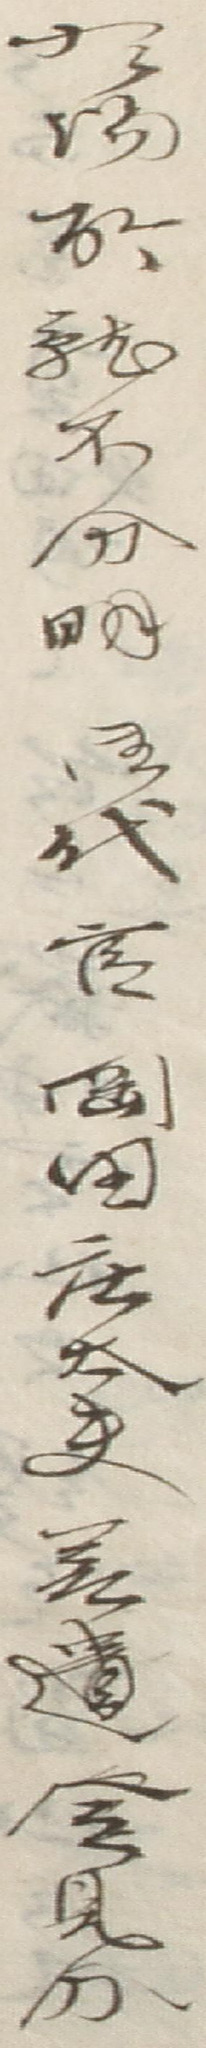右場所就不分明御代官岡田庄太夫差遣全見分
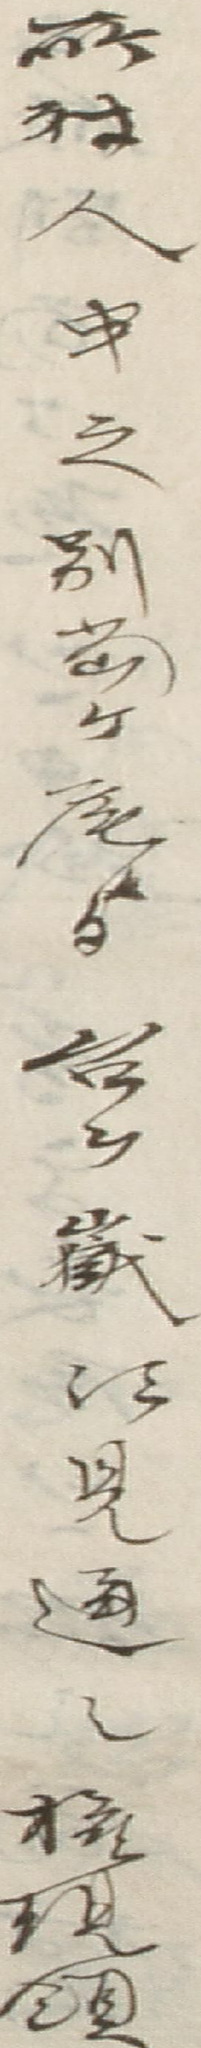所村人申之別当ケ尾ゟ台ケ嶽え見通し権現領
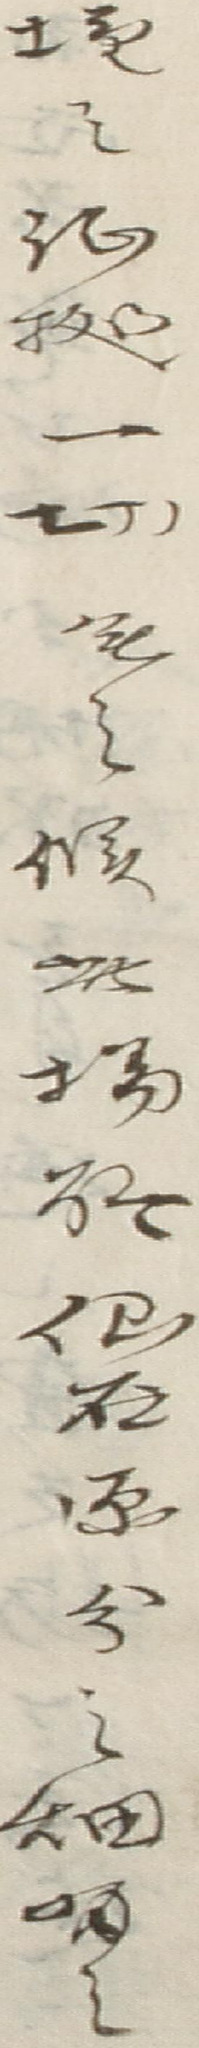境之証拠一切無之候此場所仙石原分之畑有之
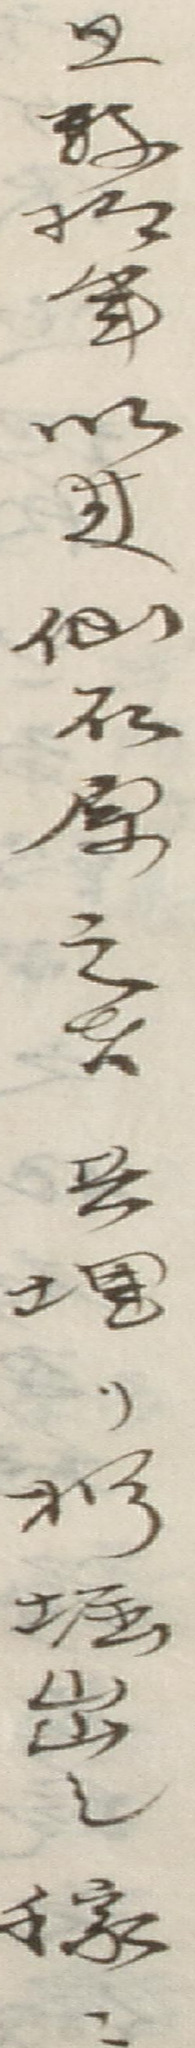且数拾年以来仙石原之者共塊り折堀出し稼ニ
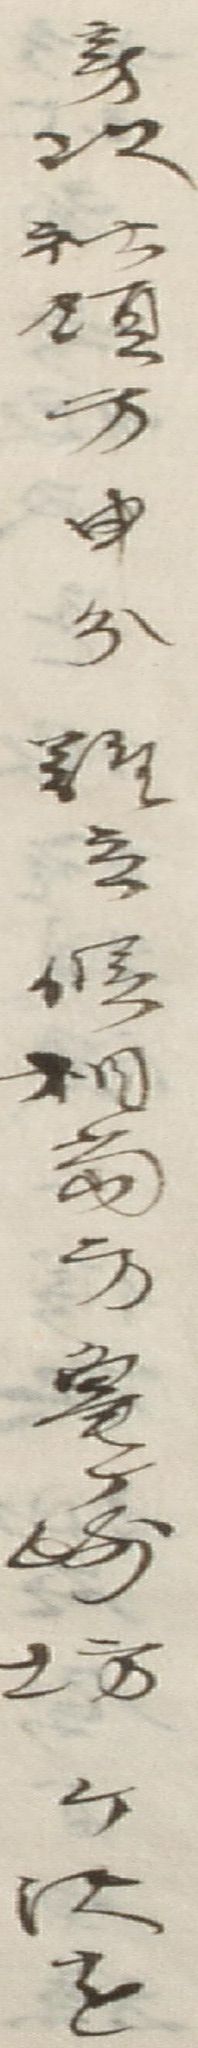旁以社領方申分難立候相当方亀ケ崎坊ケ沢を
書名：箱根湖水使用願　神奈川縣足柄下郡仙石原村外七ヶ町村
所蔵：東京大学地震研究所図書室 Earthquake Research Institute Library, The University of Tokyo, JAPAN
